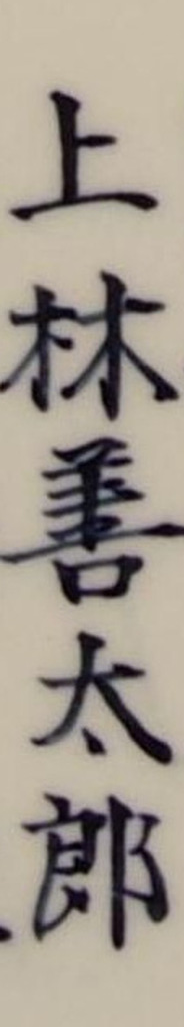上林善太郎
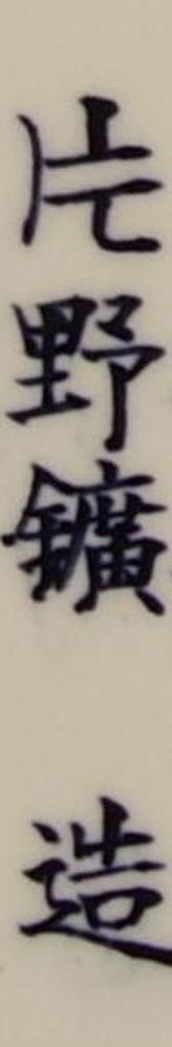片野鑛造
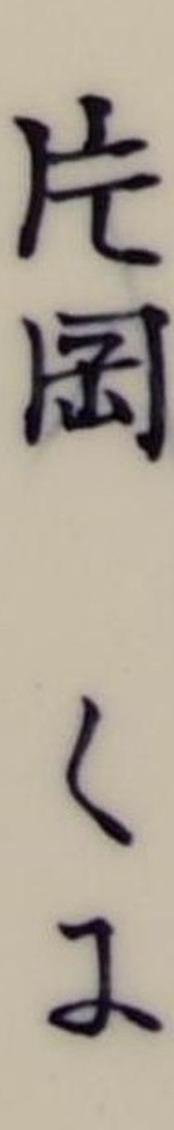片岡くに
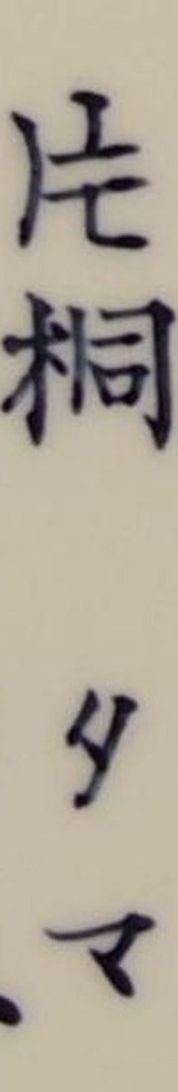片桐タマ
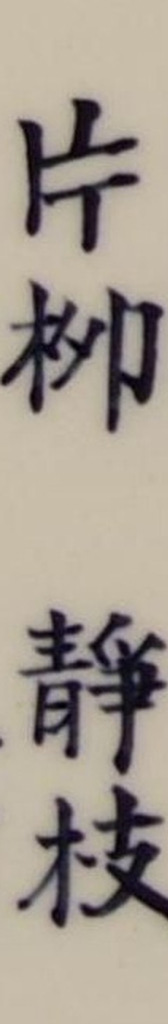片柳静枝
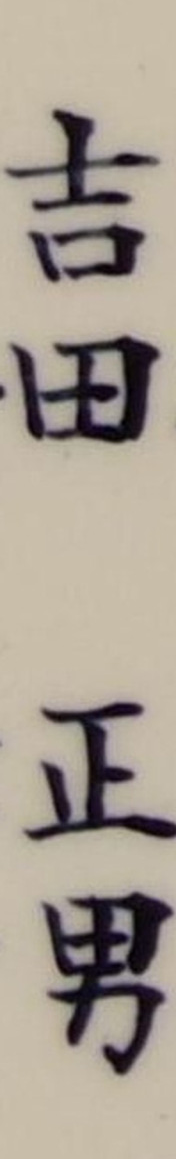吉田正男
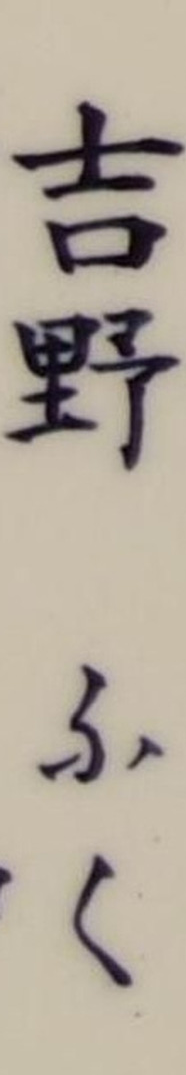吉野ふく
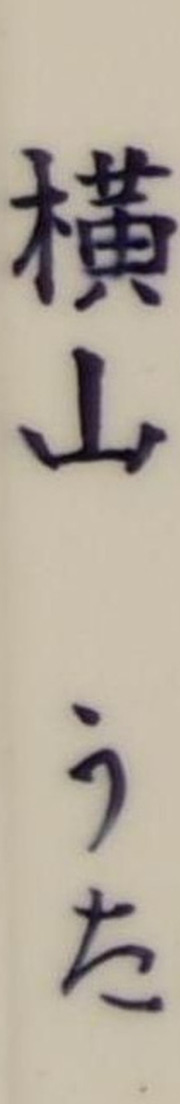横山うた

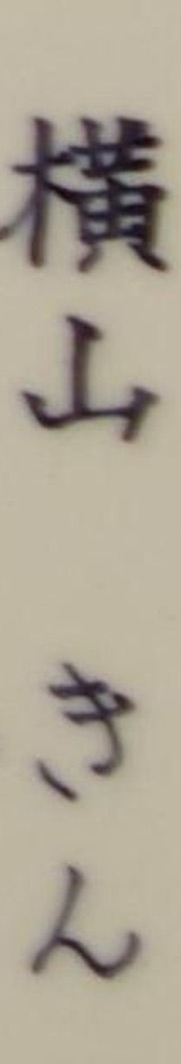横山きん
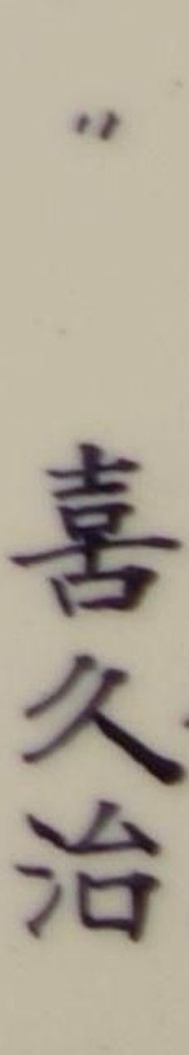喜久治
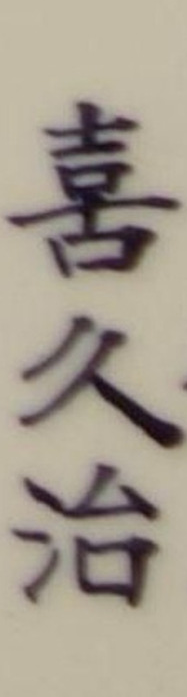喜久治
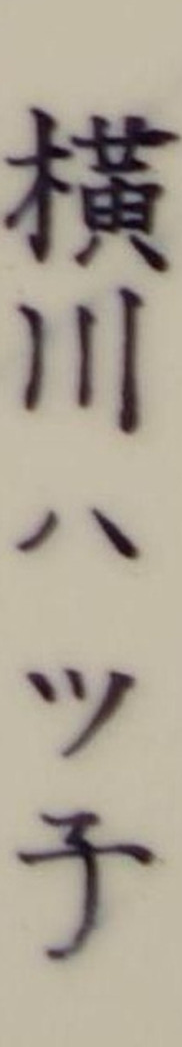横川ハツ子
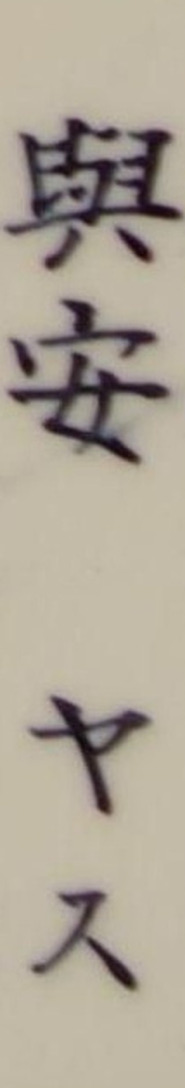与安ヤス
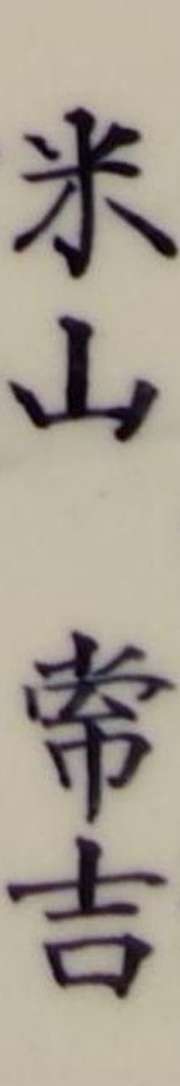米山常吉
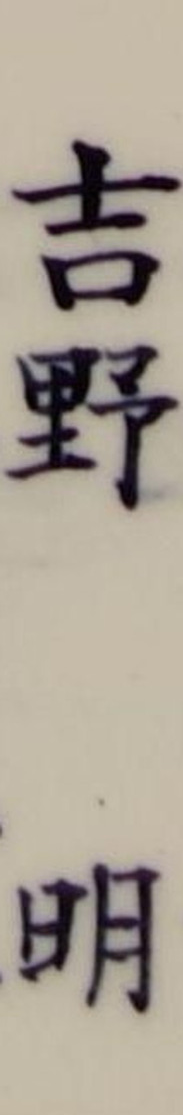吉野明
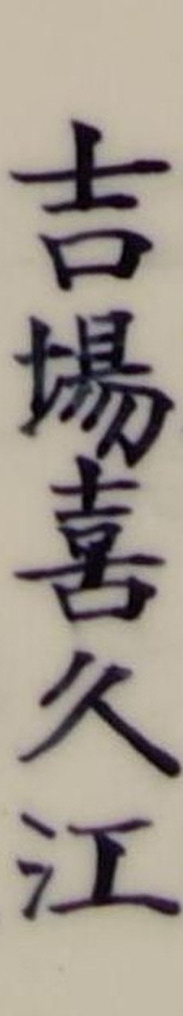吉場喜久江
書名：M~S
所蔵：高野山金剛峯寺
